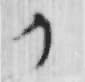人
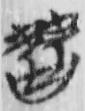朁
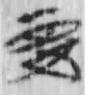妾
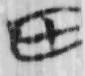甲
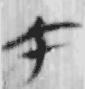午
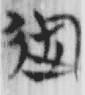○（卜）
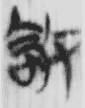○（令）
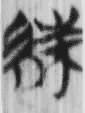絑
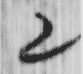乙
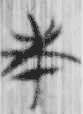未
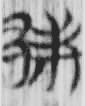○（奉）
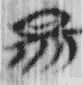昜（陽）
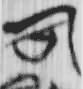司
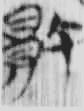敗
